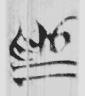爲
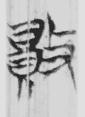{貝貝攴}
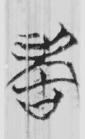𬚋
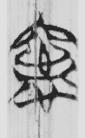{穴心皿}
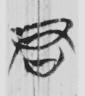君
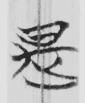是
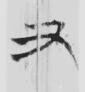又
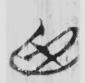臣
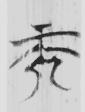而
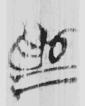爲
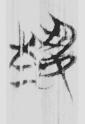埶
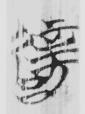辟
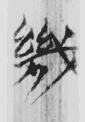幾
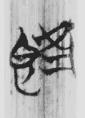既
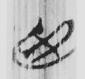臣
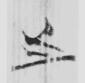之
